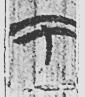于
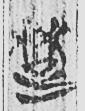楚
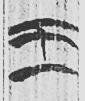王
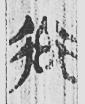率
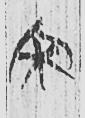宋
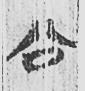公
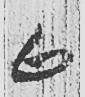㠯（以）
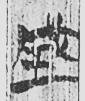城
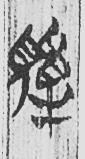{見牛賣}
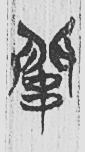{門串}
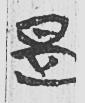是
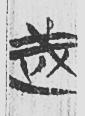武
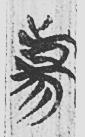{㫃昜}
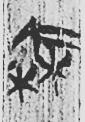秦
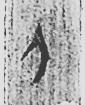人
